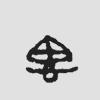思
